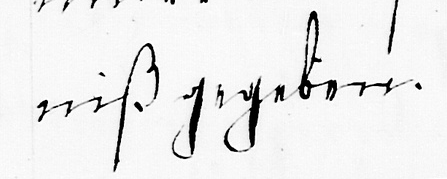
niß gegeben.
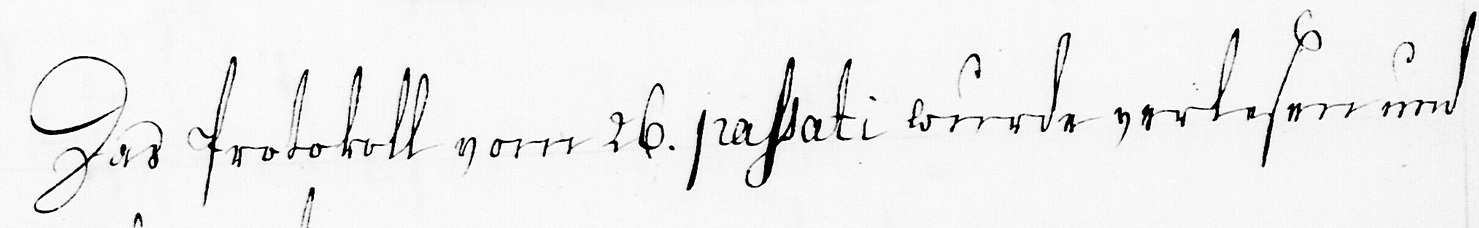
Das Protokoll vom 26. passati wurde verlesen und
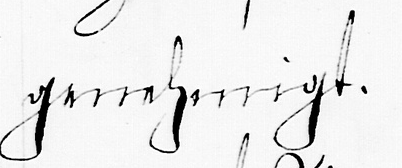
genehmigt.
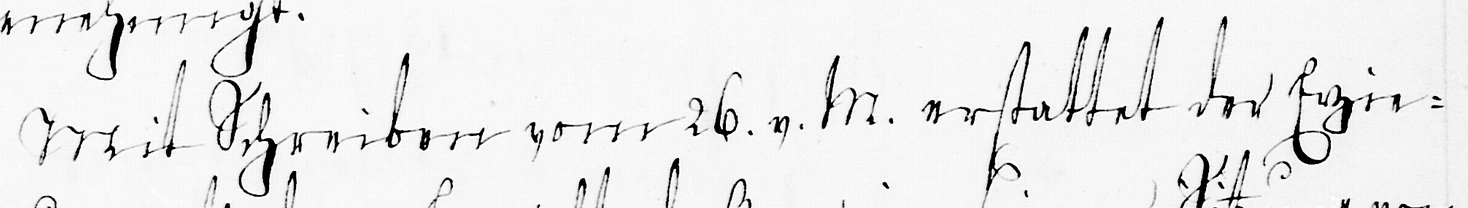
Mit Schreiben vom 26. v. M. erstattet der Erzie¬
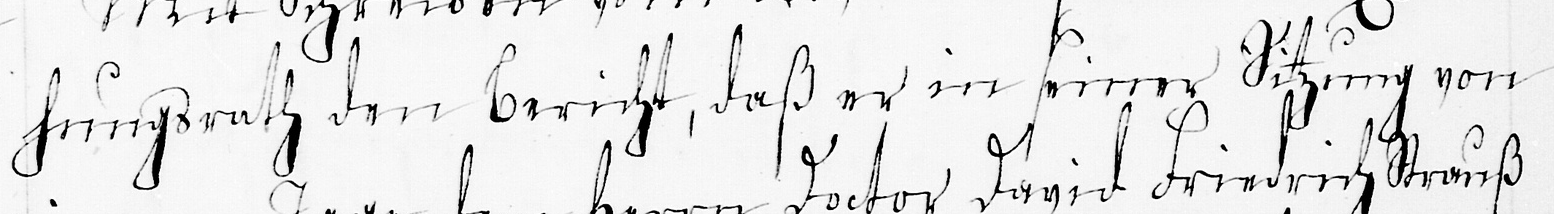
hungsrath den Bericht, daß er in seiner Sitzung von
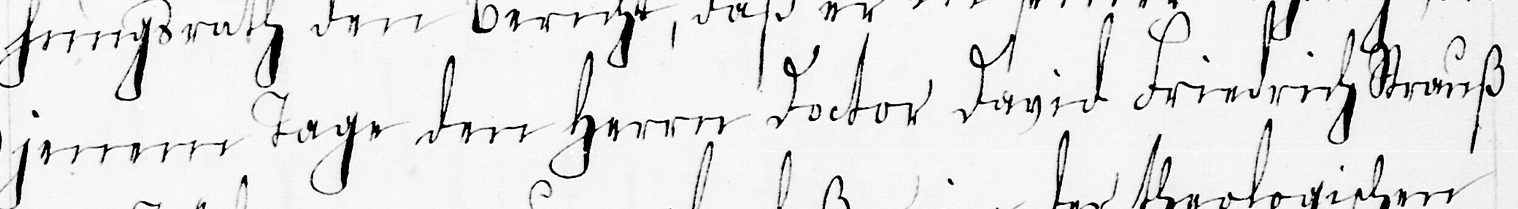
jenem Tage den Herrn Doctor David Friedrich Strauß
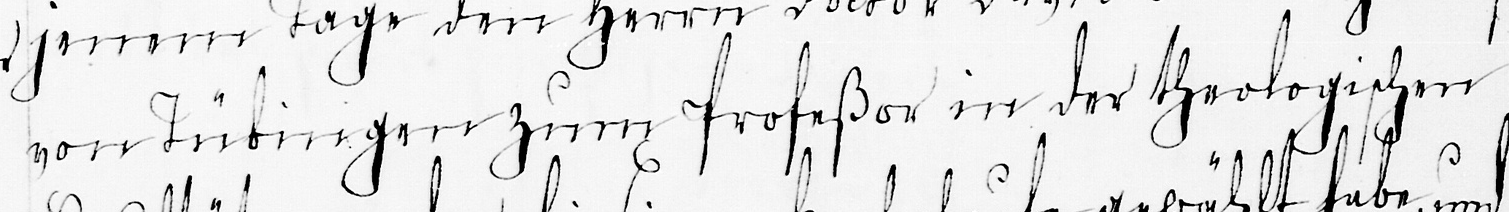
von Tübingen zum Profeßor in der theologischen
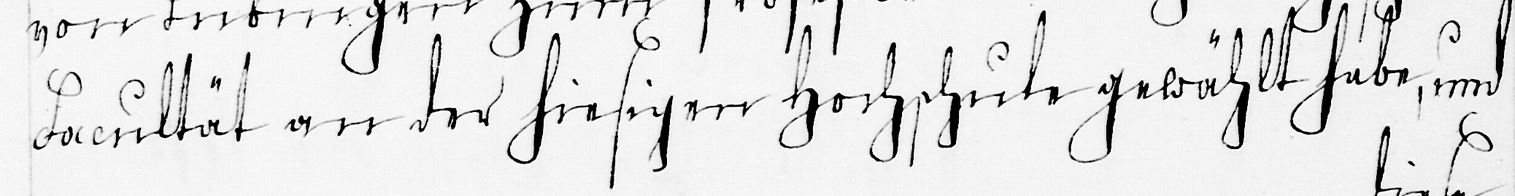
Facultät an der hiesigen Hochschule gewählt habe, und
